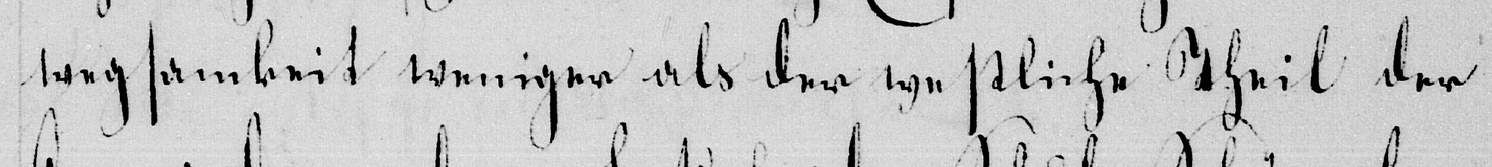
wegsamkeit weniger als der westliche Theil der
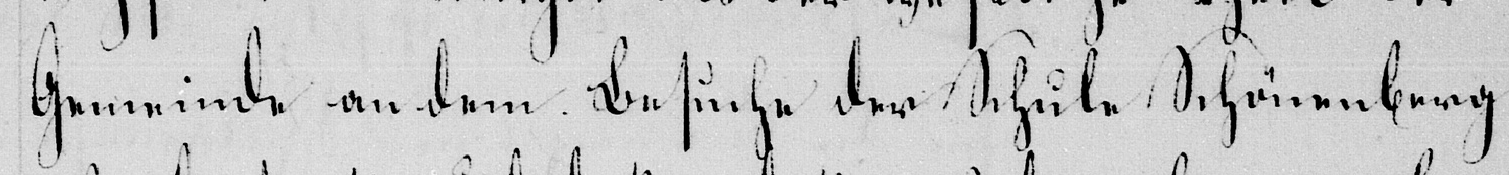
Gemeinde an dem Besuche der Schule Schönenberg
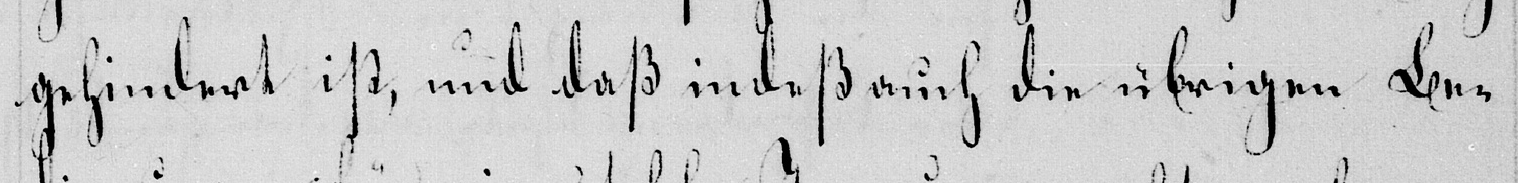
gehindert ist, und daß indeß auch die übrigen Be¬
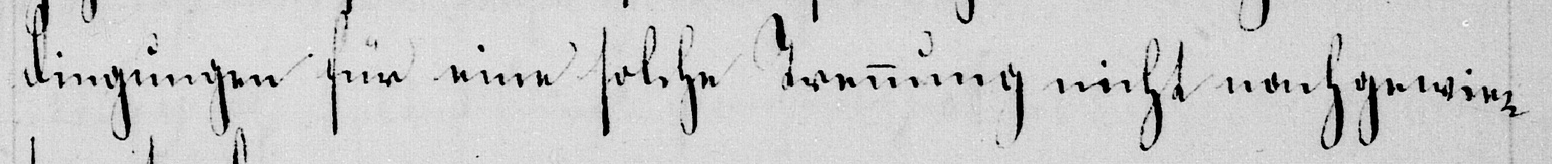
dingungen für eine solche Trennung nicht nachgewies¬
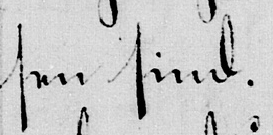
en sind.
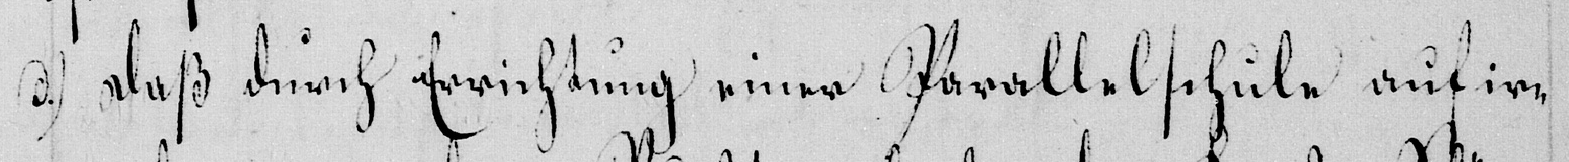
d.) Daß durch Errichtung einer Parallelschule auf ir¬
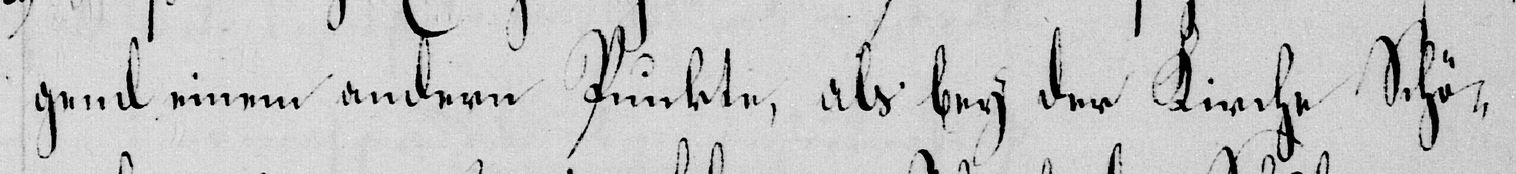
gend einem andern Punkte, als bey der Kirche Schö¬
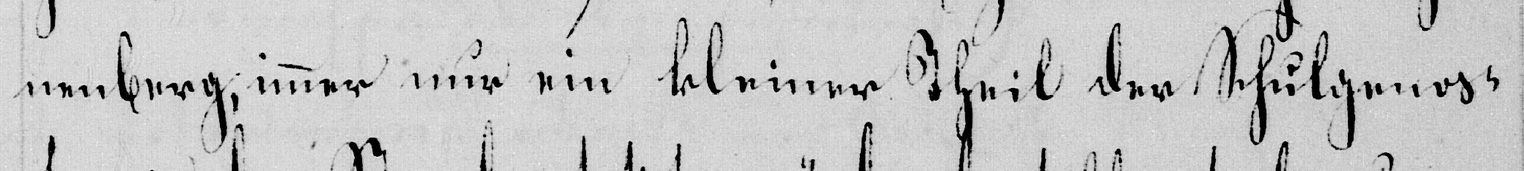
nenberg, immer nur ein kleiner Theil der Schulgenoß¬
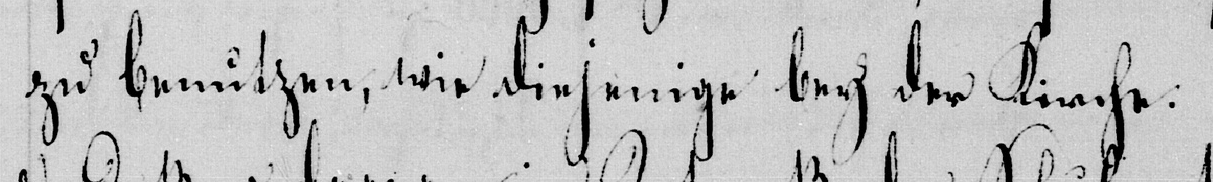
zu benutzen, wie diejenige bey der Kirche.
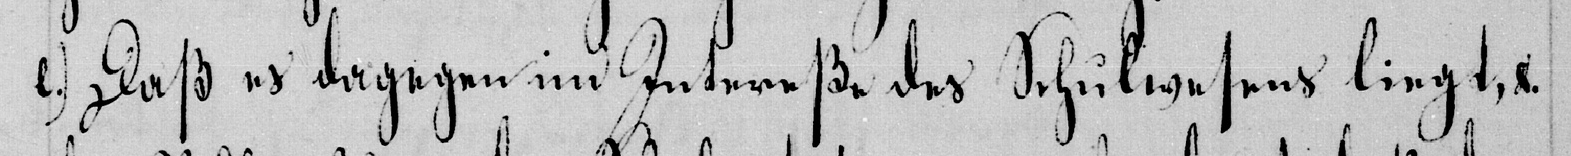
e.) Daß es dagegen im Intereße des Schulwesens liegt, &.
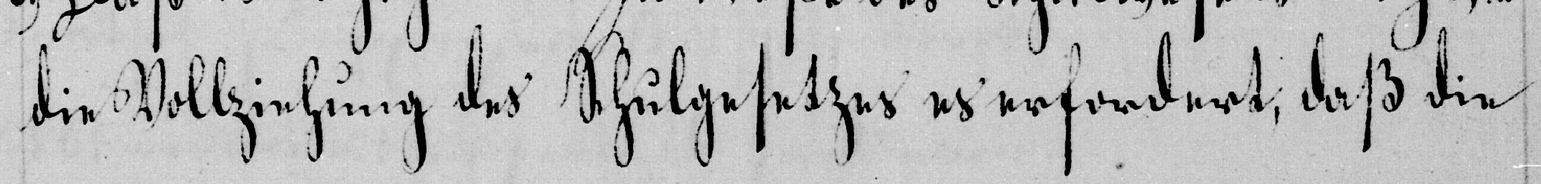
die Vollziehung des Schulgesetzes es erfordert, daß die
